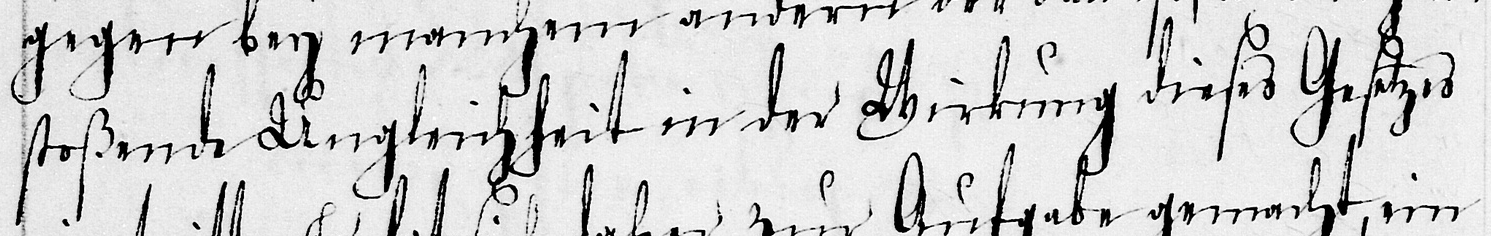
stoßende Ungleichheit in der Wirkung dieses Gesetzes
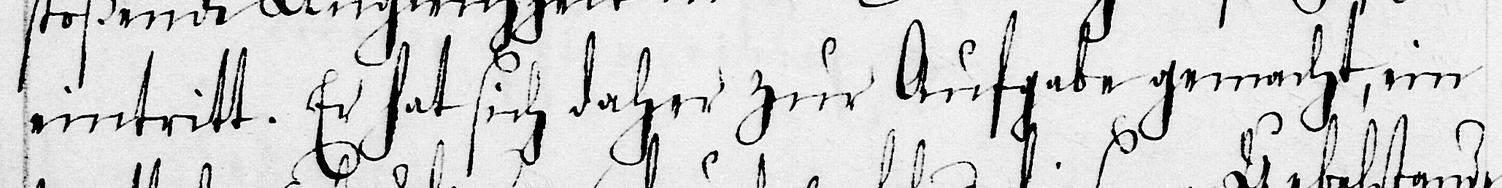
eintritt. Er hat sich daher zur Aufgabe gemacht, ein
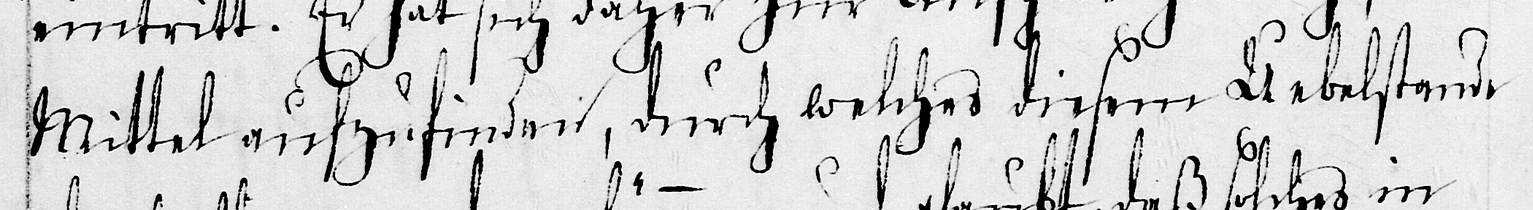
Mittel aufzufinden, durch welches diesem Uebelstande
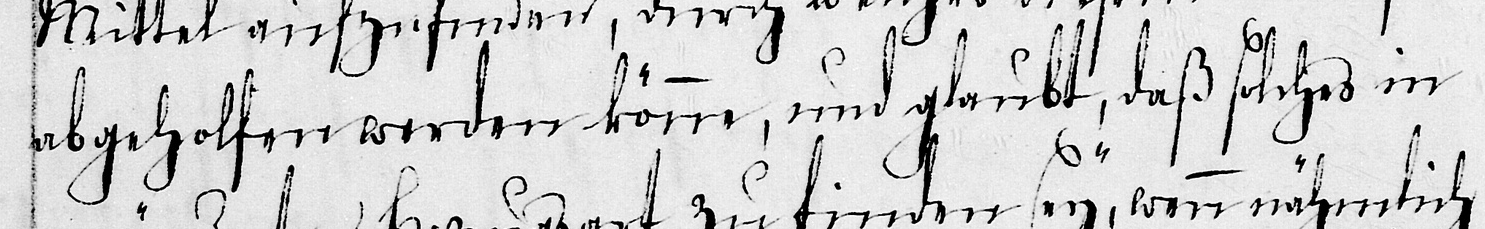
abgeholfen werden könne, und glaubt, daß solches in
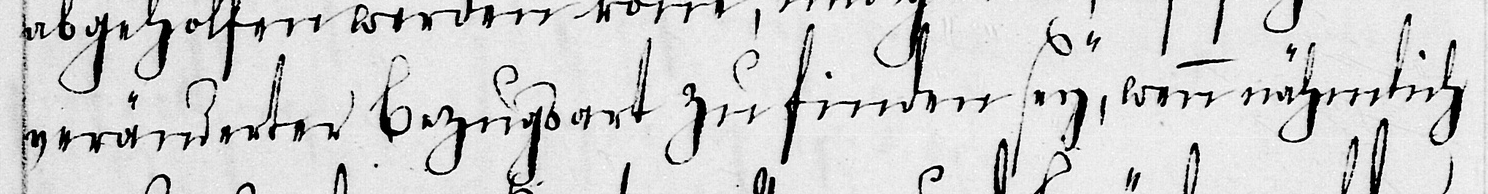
veränderter Bezugsart zu finden sey, wenn nähmlich
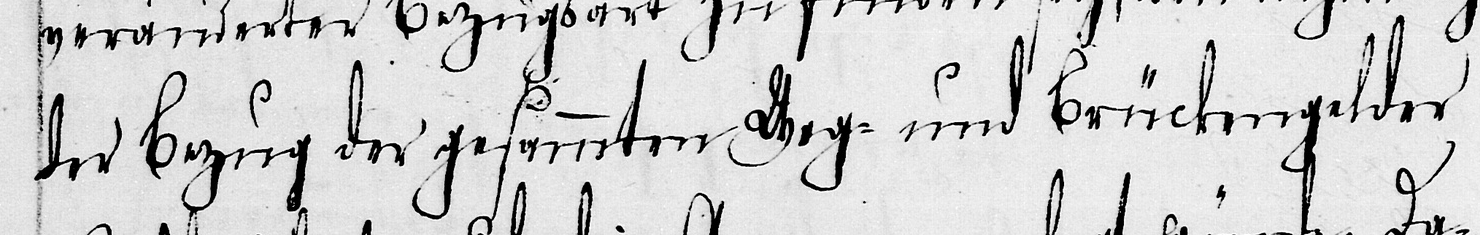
der Bezug der gesammten Weg- und Brückengelder
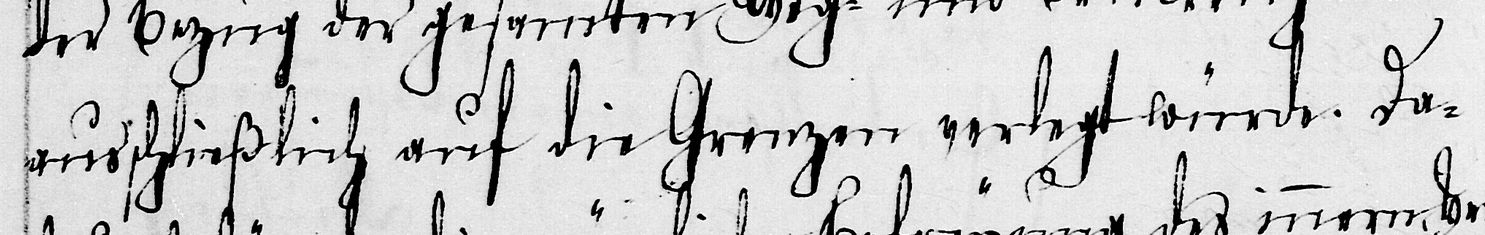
ausschließlich auf die Grenzen verlegt würde. Da¬
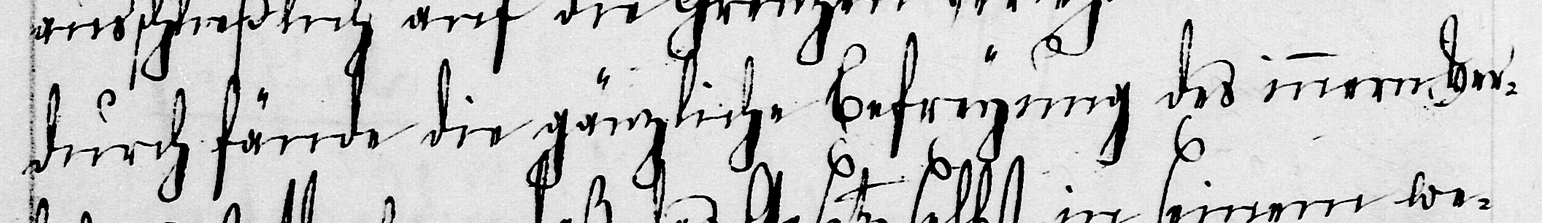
durch fände die gänzliche Befreyung des innern Ver¬
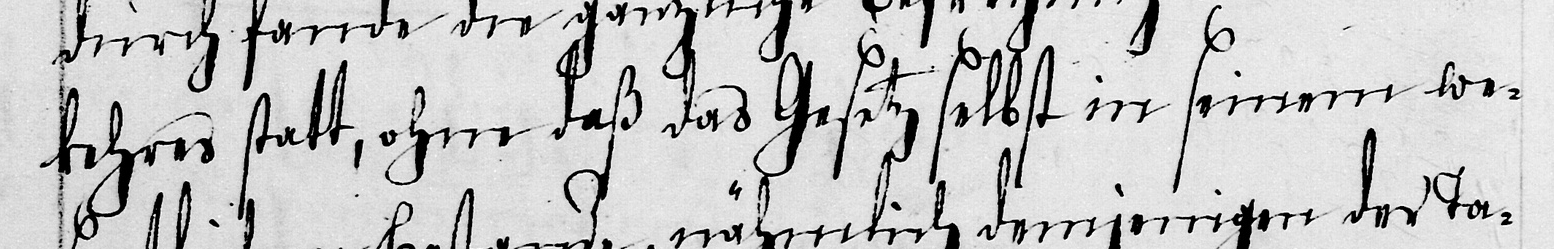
kehres statt, ohne daß das Gesetz selbst in seinem we¬
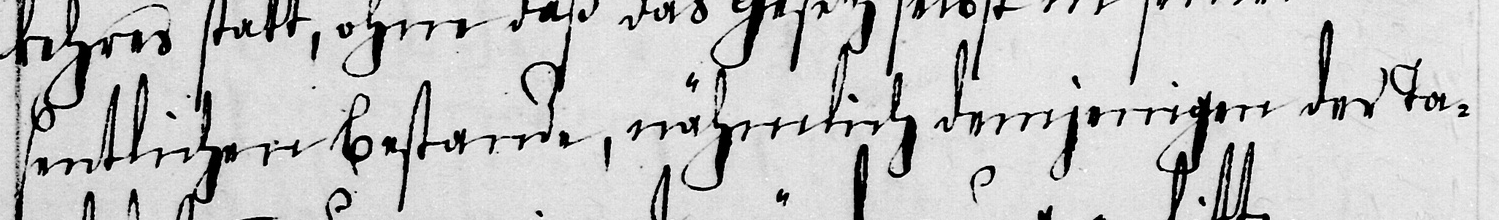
sentlichen Bestande, nähmlich demjenigen der Ta¬
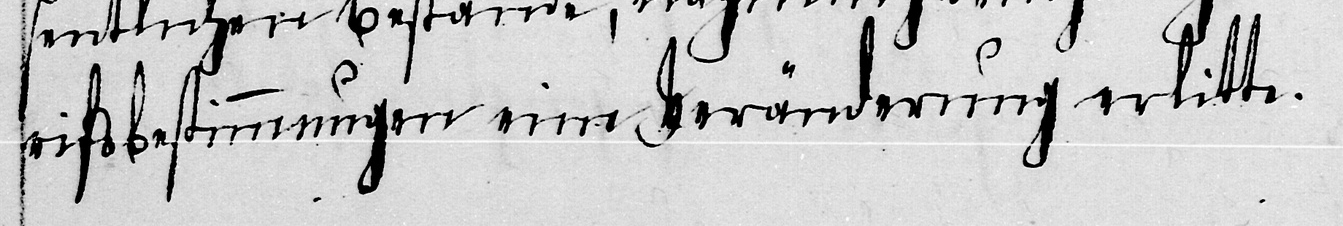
rifsbestimmungen eine Veränderung erlitte.
